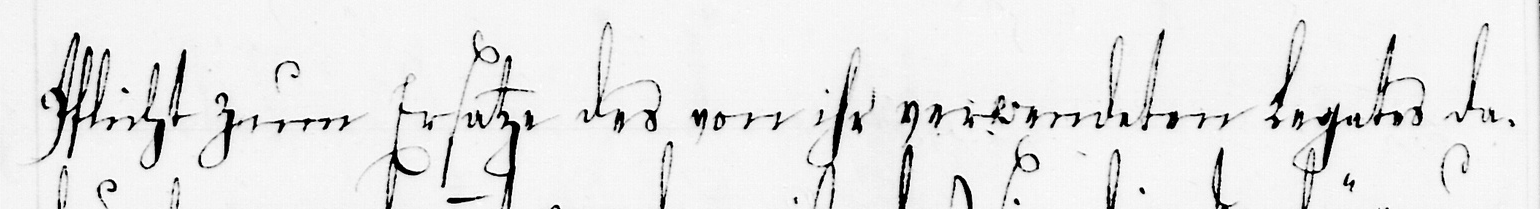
Pflicht zum Ersatze des von ihr verwendeten Legates da¬
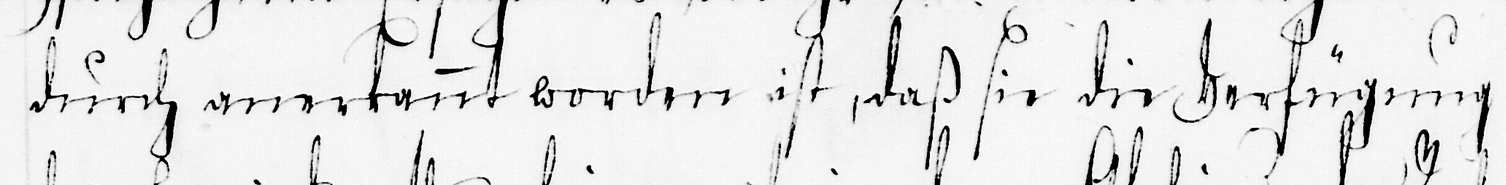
durch anerkannt worden ist, daß sie die Verfügung
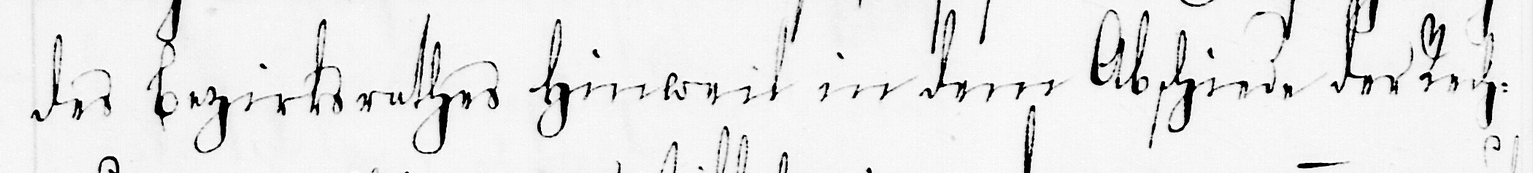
des Bezirksrathes Hinweil in dem Abschiede der Rech¬
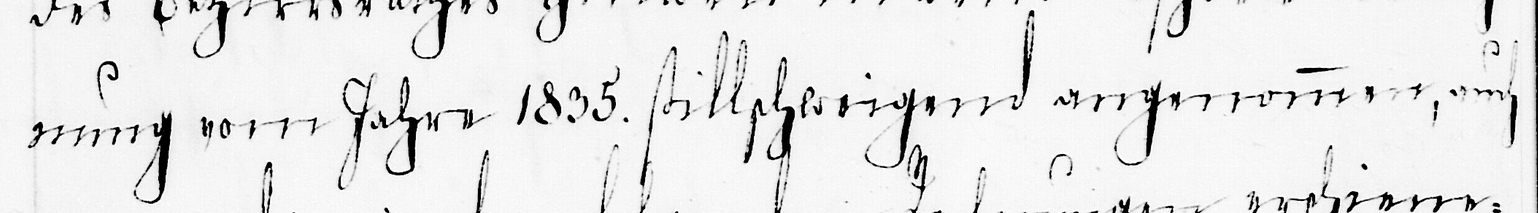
nung vom Jahre 1835. stillschweigend angenommen, auch
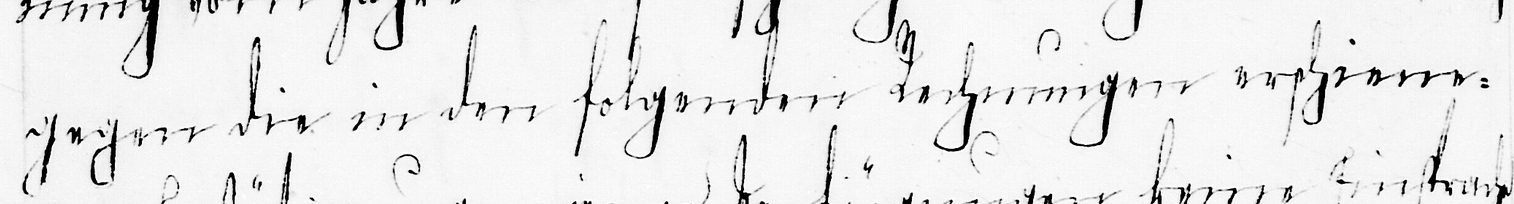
gegen die in den folgenden Rechnungen erschiene¬
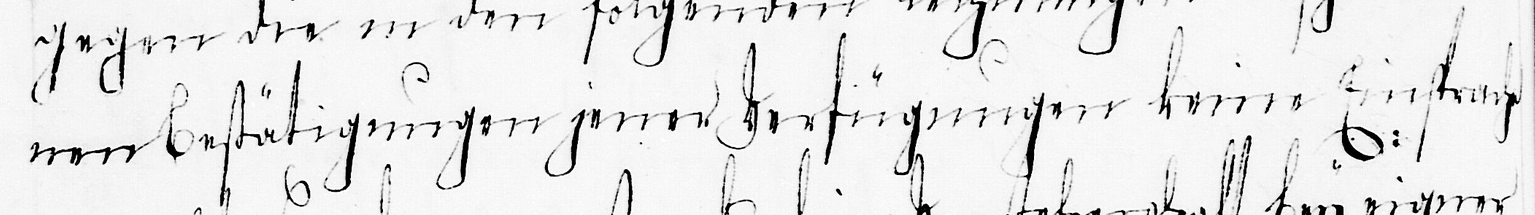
nen Bestätigungen jener Verfügungen keine Einsprache
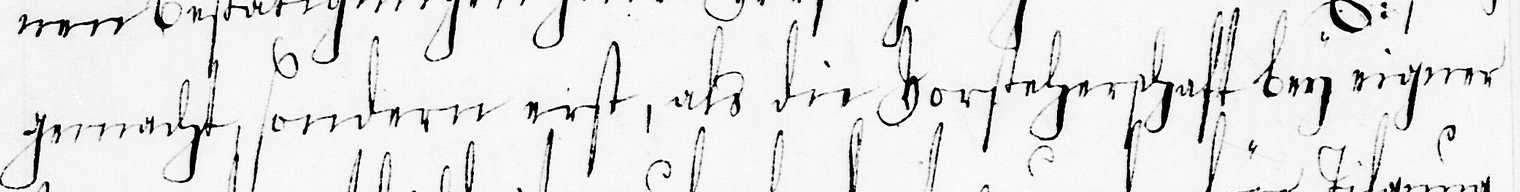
gemacht, sondern erst, als die Vorsteherschaft bey eigner
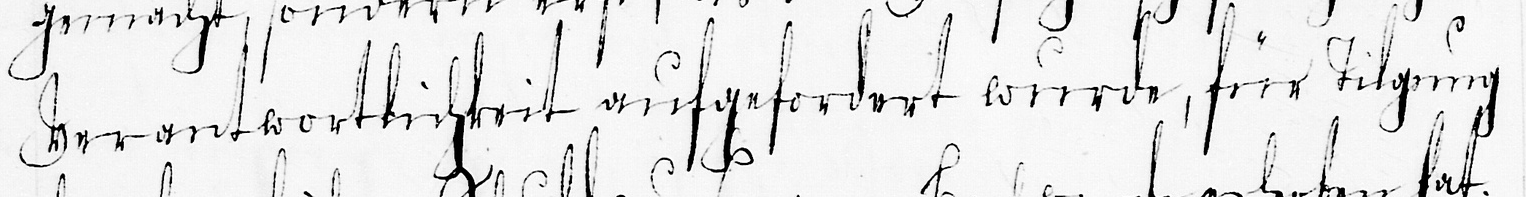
Verantwortlichkeit aufgefordert wurde, für Tilgung
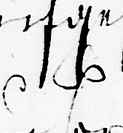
1. Fr¬
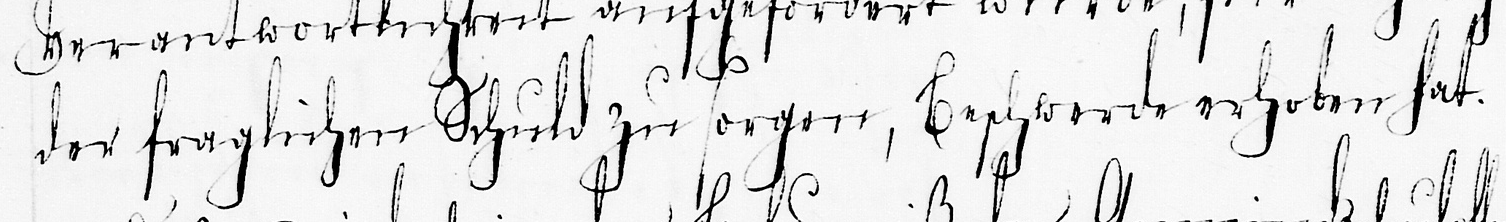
der fraglichen Schuld zu sorgen, Beschwerde erhoben hat.
